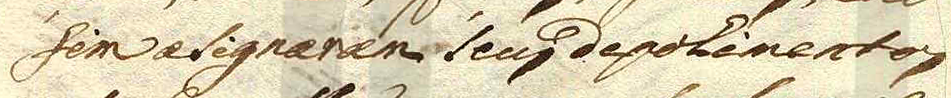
fim asignaram seus depohimentos
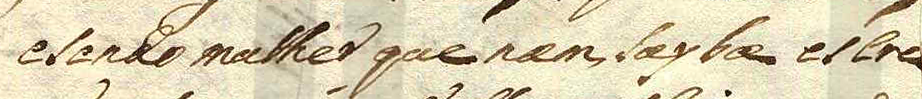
e sendo mulher que nam sayba esCre
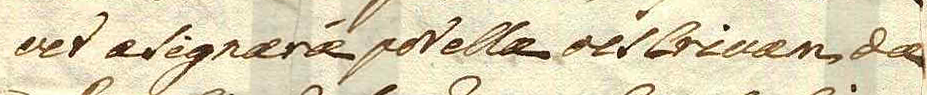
ver asignará por ella o esCriuam da
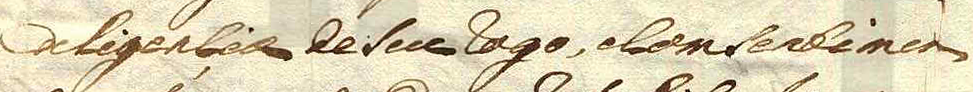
deligenCia de seu Rogo, e Comsentimen
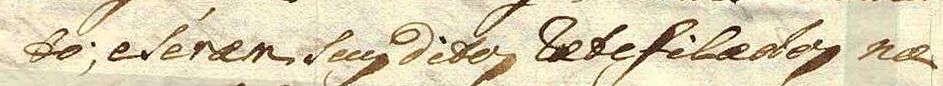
to; e seram seus ditos RatefiCados na
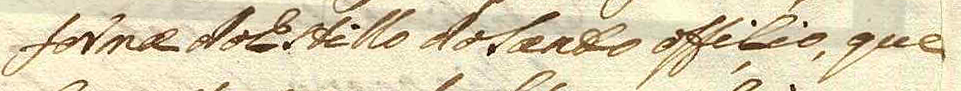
forma do Estillo do Santo offiCio, que
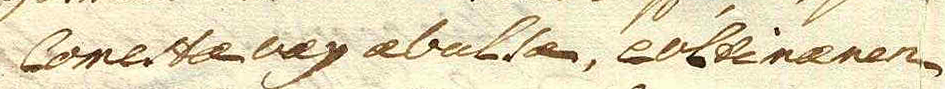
com esta vay avulsa, e ultimamen
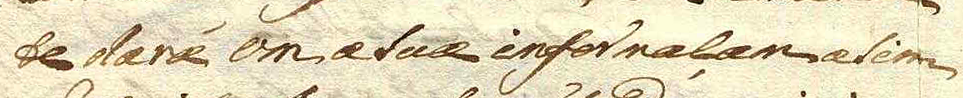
te dará vm a sua informaÇam asim
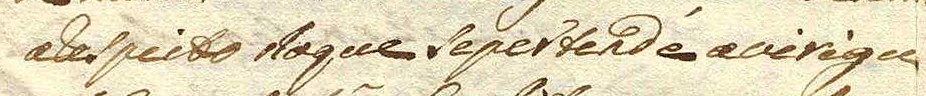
a Respeito do que se pertende avirigu
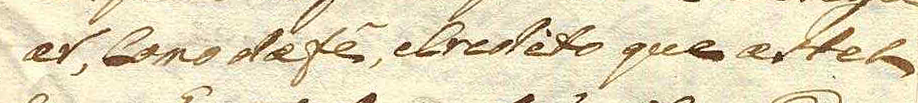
ar, Como da fé, e Credito que as tes
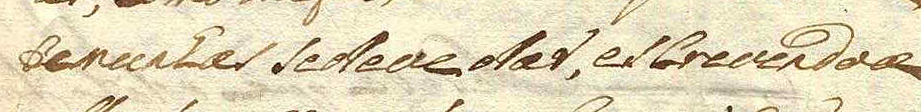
temunhas se deve dar, esCrevendoa
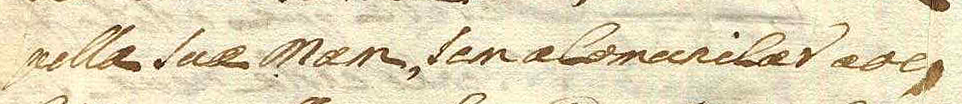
pella sua mam, sem a ComuniCar ao es
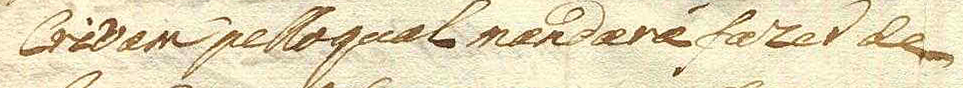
Crivam pello qual mandará fazer de
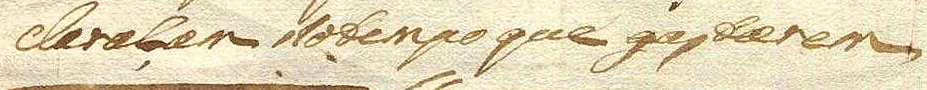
claraÇam do tempo que gastarem
